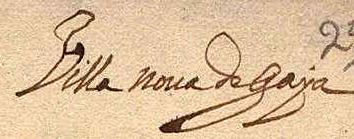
Villa noua de Gaya
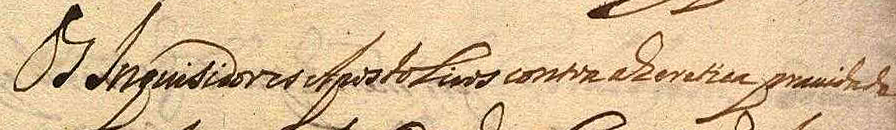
Os Inquisidores Apostolicos contra a heretica prauidade
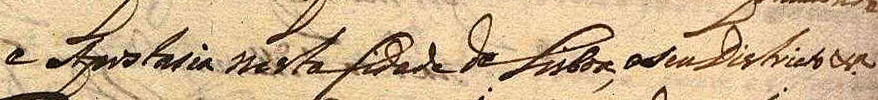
e Apostasia nesta Cidade de Lisboa, e seu Districto &.a
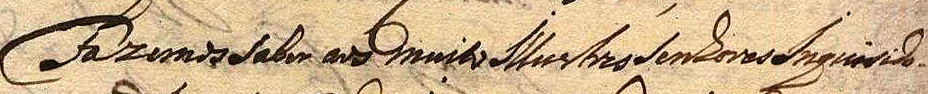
Fazemos saber aos muito Illustres Senhores Inquisido
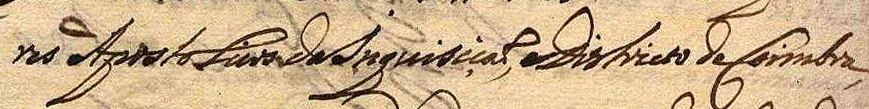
res Apostolicos da Inquisiçaõ, e Districto de Coimbra
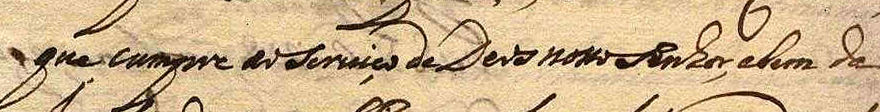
que cumpre ao seruiço de Deos nosso Senhor, e bem da
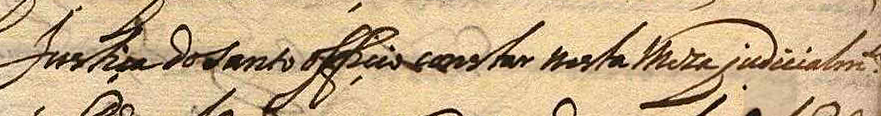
Justiça do Santo offiçio constar nesta Meza judicialmte
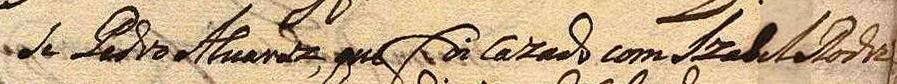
se Pedro Aluarez, que foi cazado com Izabel Rodri
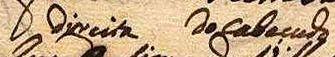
direita do Cabeçudo
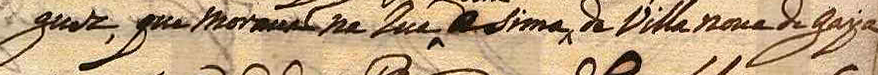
guez, que morauaõ na Rua asima, de Villa noua de Gaya
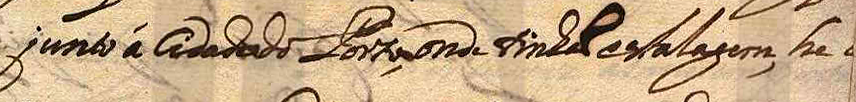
junto à Cidade do Porto, onde tinha estalagem, he o
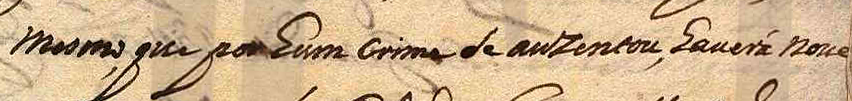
mesmo, que por hum crime se auzentou, hauerá noue
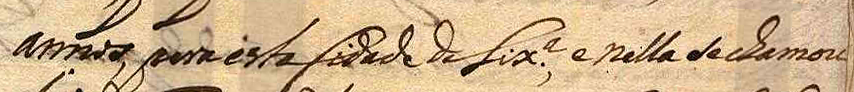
annos, pera esta Cidade de Lix.a e nella se chamou
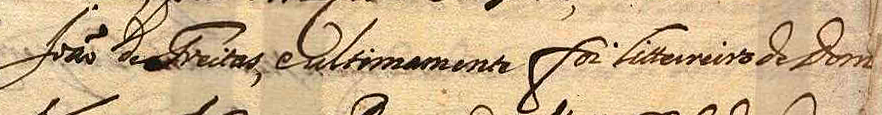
Joaõ de Freitas, e ultimamente foi litteireiro de Dom
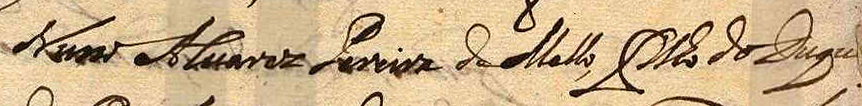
Nuno Aluarez Pereira de Mello, filho do Duque
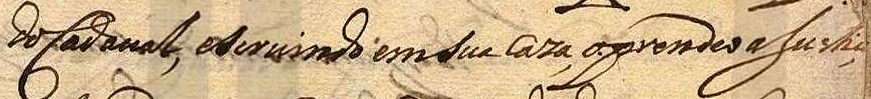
do Cadaual, e seruindo em sua caza, o prendeo a Justiça
